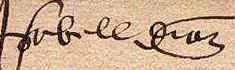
Jsabell diaz
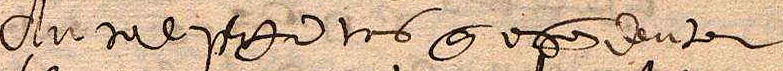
Auto de p̄gūtas q̄ o s̄or doutor
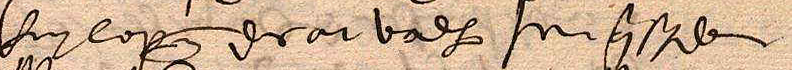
Ruj lopez de carvalho Jmqisydor
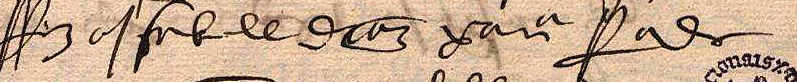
ffez a Jsabell diaz xa na fa de
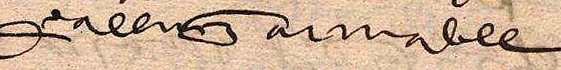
do alluēz armadell
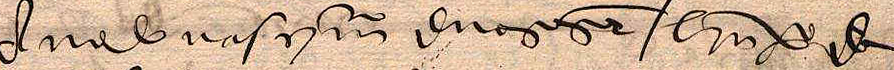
Ano do nascjmto de noso s̄or Jhū xo de
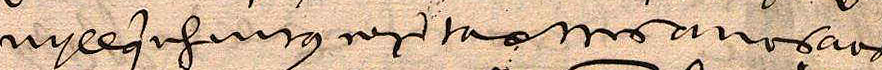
mjll qinhentꝯ corēta e tres anos aos
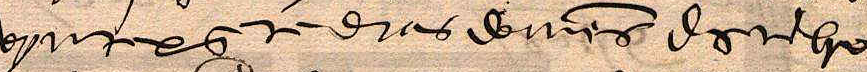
vynte e sete dias do mēs de setēbro
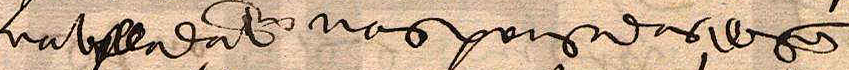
na vylla davro nas pousadas do s̄or
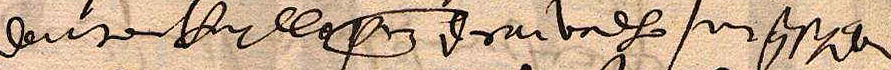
doutor Ruj llopez de carvalho Jmqisydor
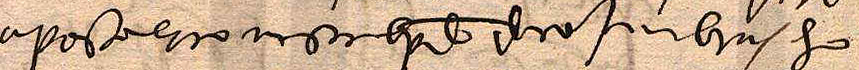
apostolico neste bp̄ado de coJmbra / ho
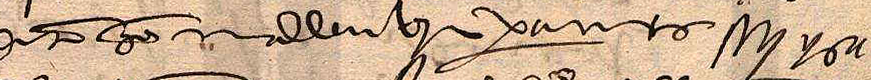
dito s̄or mādou vjr ꝑante ssy ysa
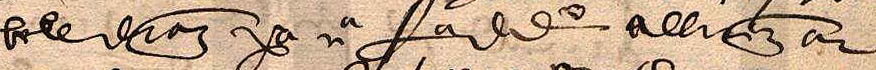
bell diaz xa na fa de do alluēz ar
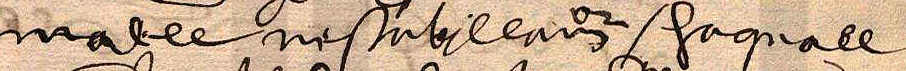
madell nesta vjlla mor / ha quall
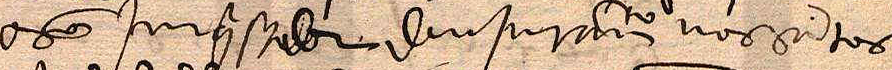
o s̄or Jmqisydor deu Juramto nos sātos
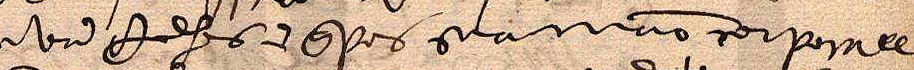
evāgelhos ē q̄ pos sua mão corporall
